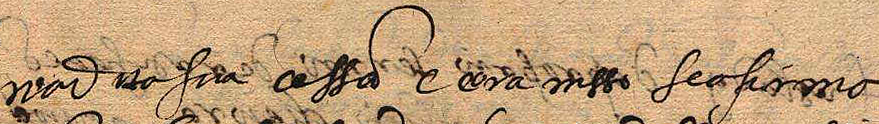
na dita sua cessaõ e oora nisso se afirma
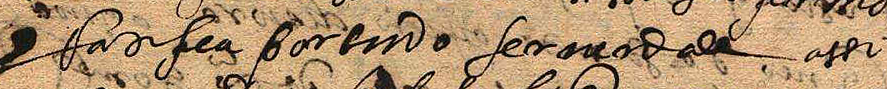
E Ratifica por tudo ser uerdade assi
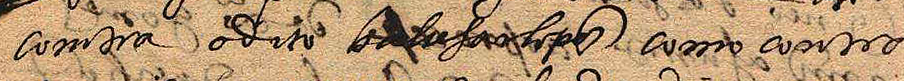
comtra o dito baltesar lopez̄ como contra
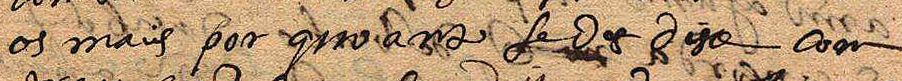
os mais porquoanto se desdise com
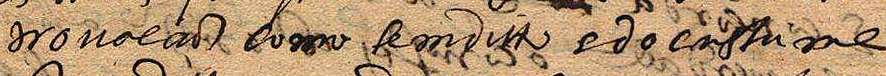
trouacaõ como tem ditto E do custume
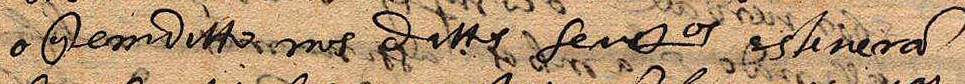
o q̄ tem ditto nos dittos seus tos Estiueraõ
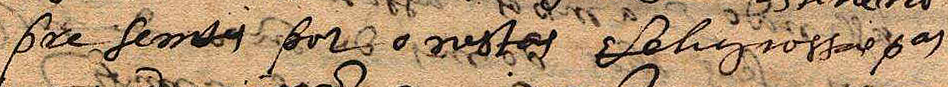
presemtes por onestas E religiossas pas
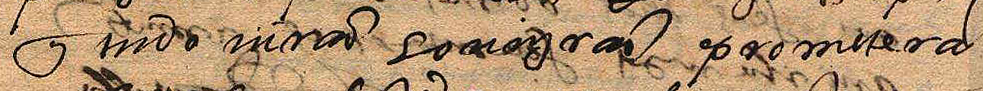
q̄ tudo uiraõ E ouujraõ e prometeraõ
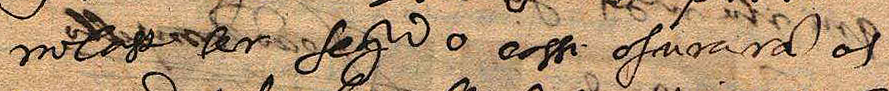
no casso ter seḡdo e assi o juraraõ os
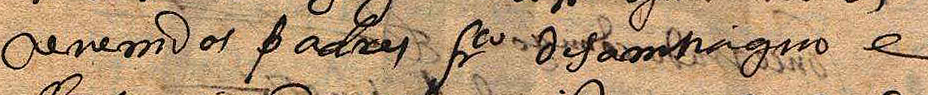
Reueremdos padres frco de samtiaguo e
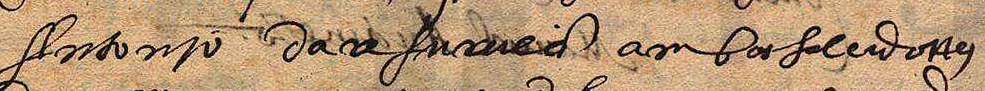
Antonjo da resureicaõ ambos sacerdottes
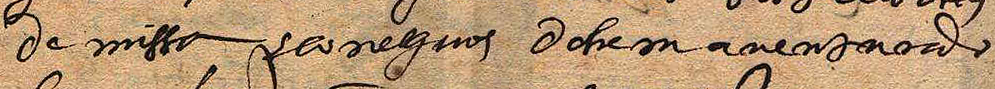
de missa E coneguos do bem auenturado
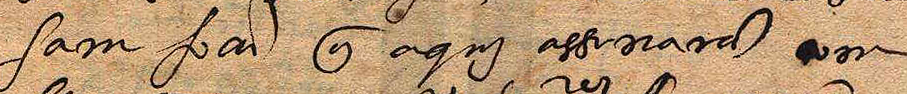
sam Joaõ q̄ aquj assinaraõ com
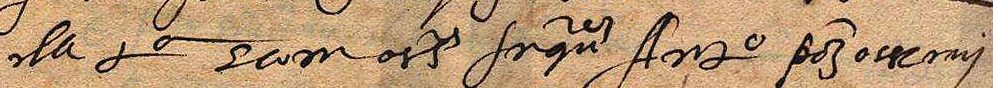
elle ta E com os srs Jnqures Anto piz̄ o escruj
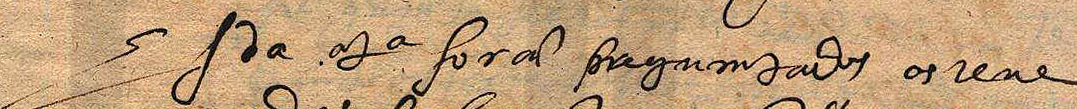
E Jda a ta foraõ pregumtados os reue
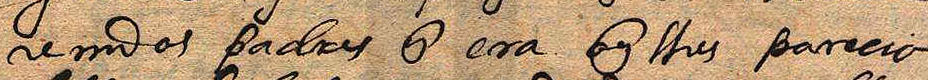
remdos padres q̄ era o q̄ lhes parecia
